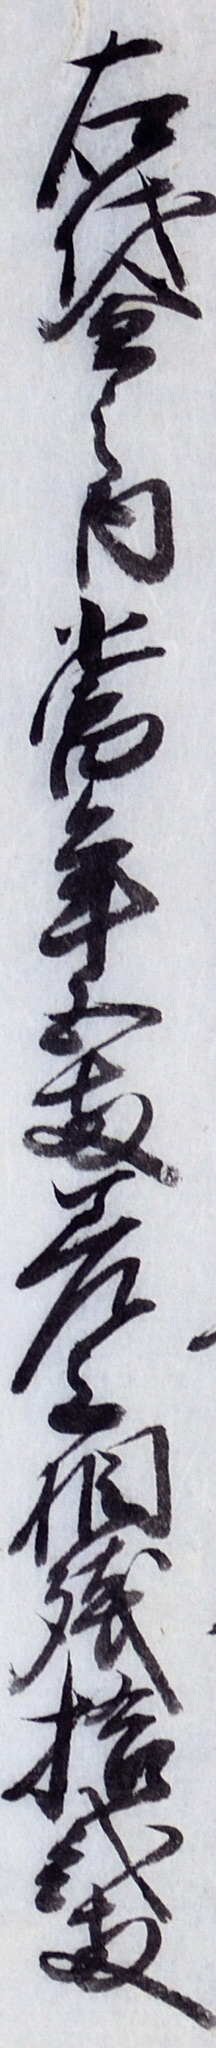右代金之内当年五両差上相残拾弐両
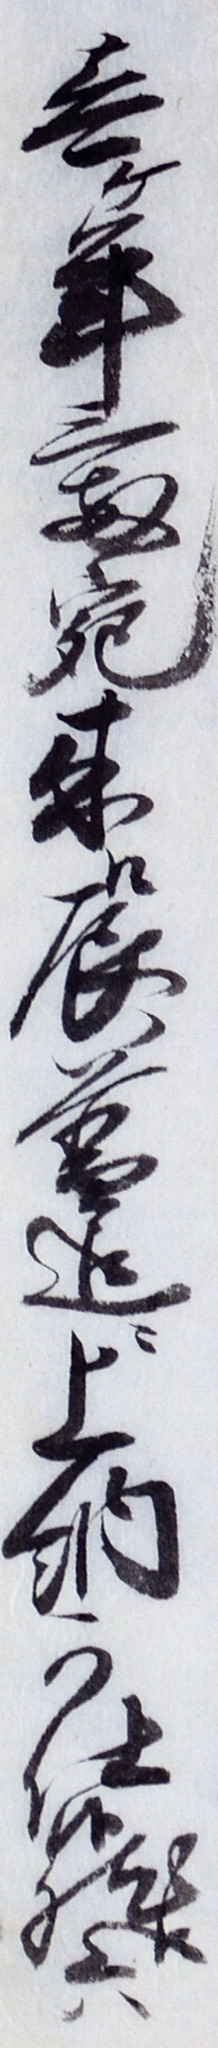壱ヶ年三両宛来ル辰ノ暮迄ニ上納可仕候然ル上ハ
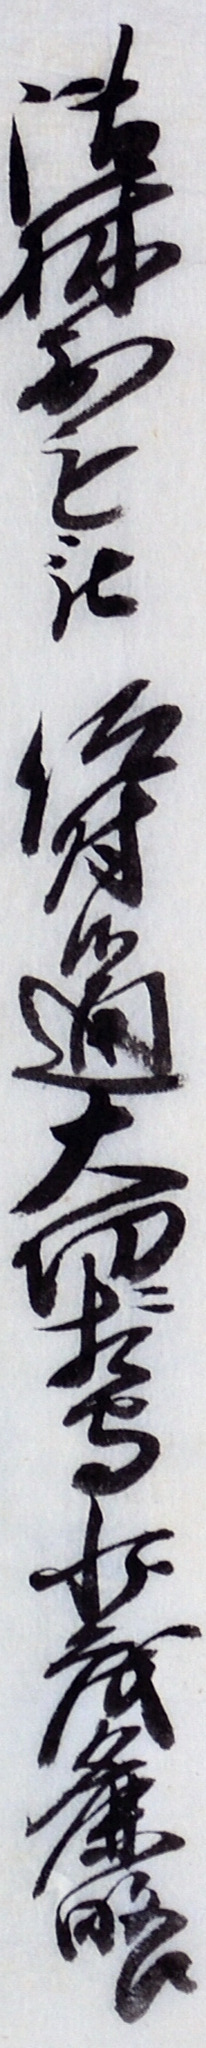御林被仰付候通大切ニ相守少しも麁略
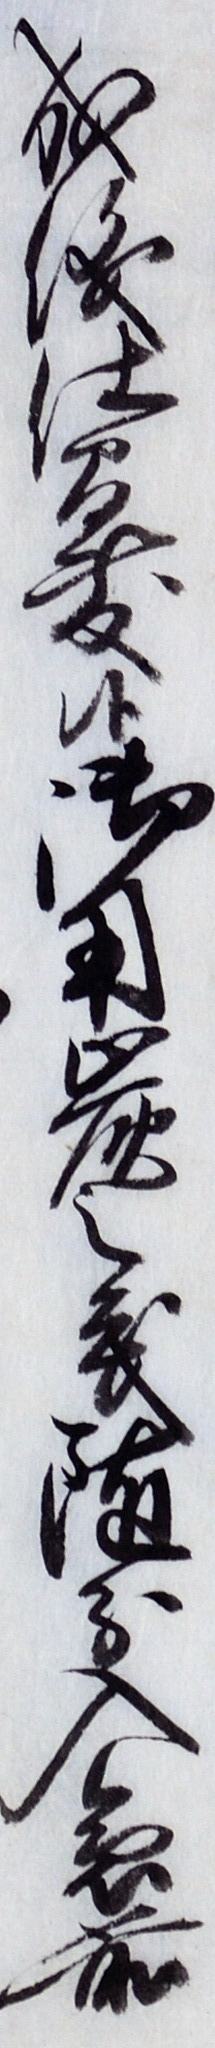成儀仕間敷候御用炭之義随分入念前
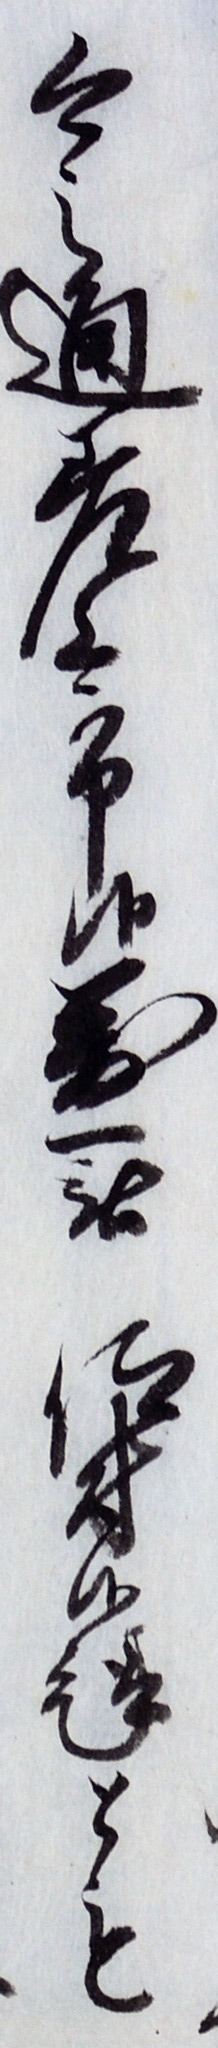々之通差上可申候万一被仰付候趣とも
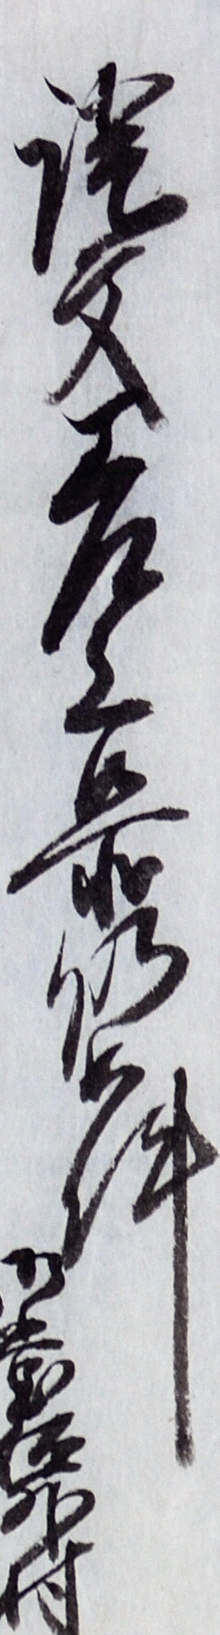証文差上候所仍如件
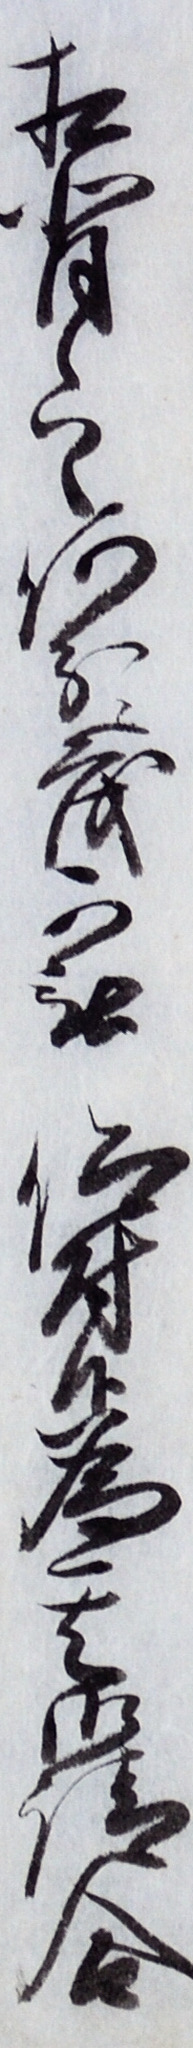相背候ハヽ何分ニも可被仰付候為其御請合
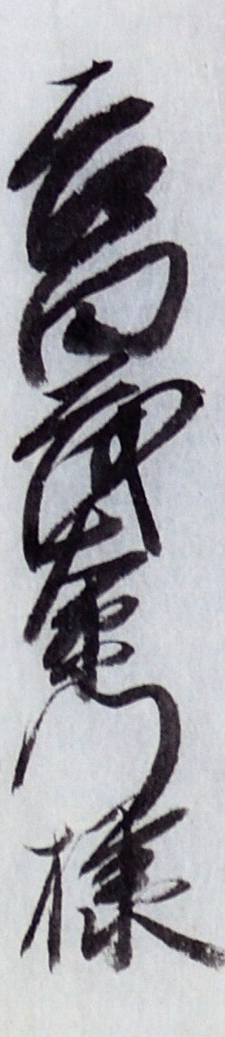吉田茂右衛門様

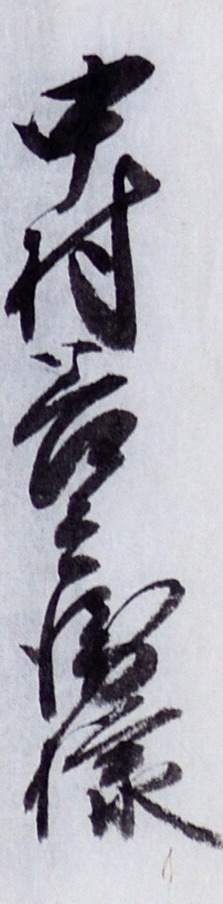中村善兵衛様
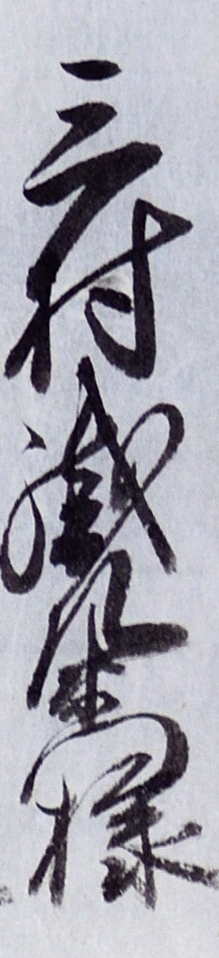三村織左衛門様
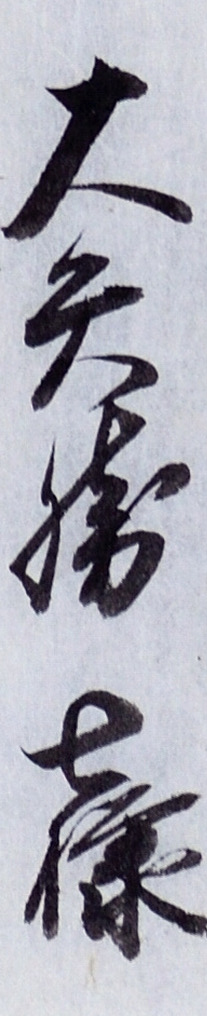大矢勝七様
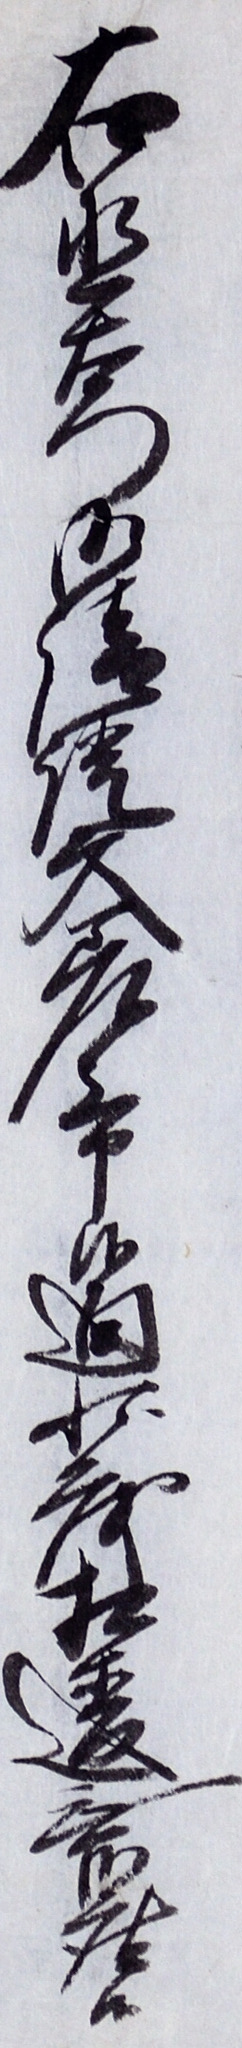右直右衛門御請証文差上申候通少も相違無御座候
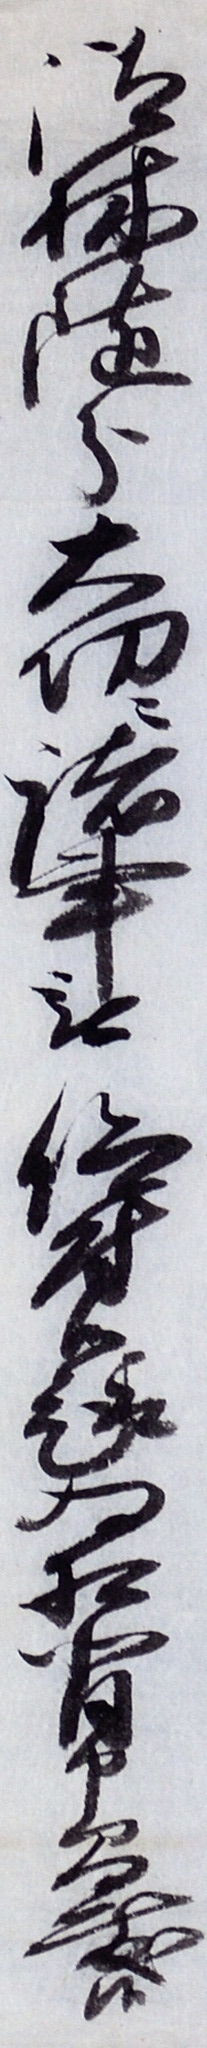御林随分大切ニ諸事被仰付候趣為相背申間敷候
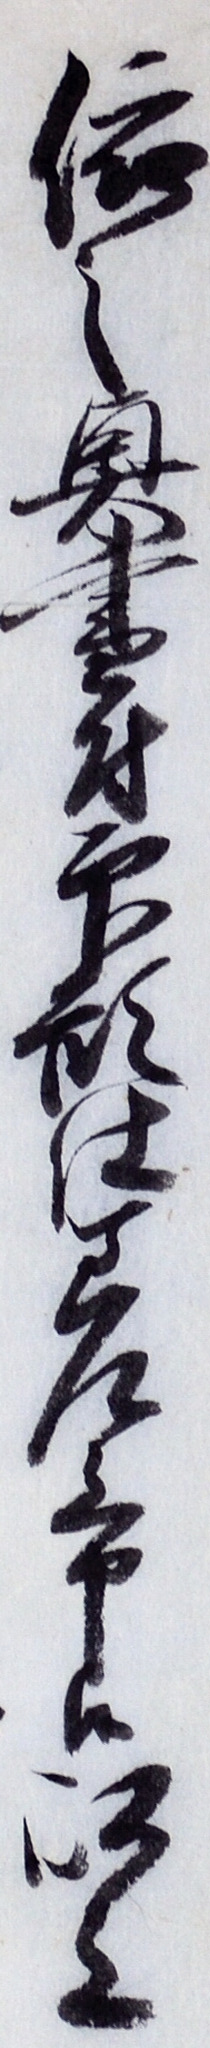依之奥書付印形仕差上申候以上
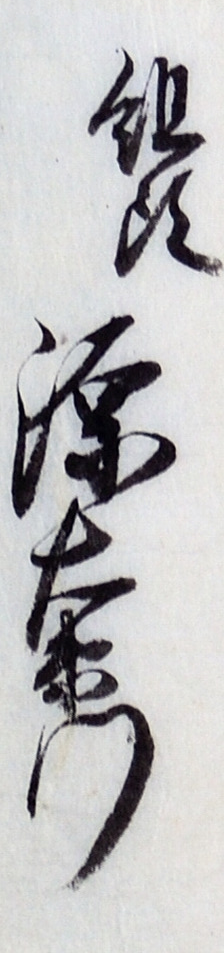組頭源右衛門
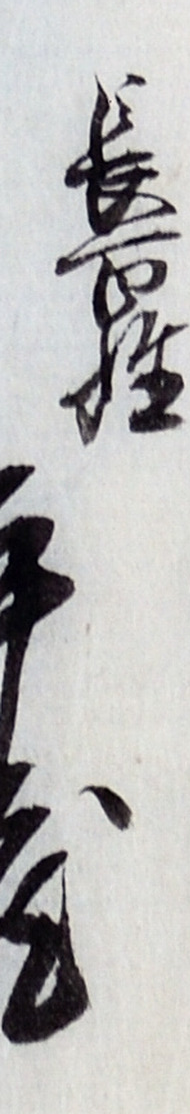長百姓平蔵
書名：御持山御払掟書願書控
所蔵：伊那市立高遠町図書館・合同会社AMANE
